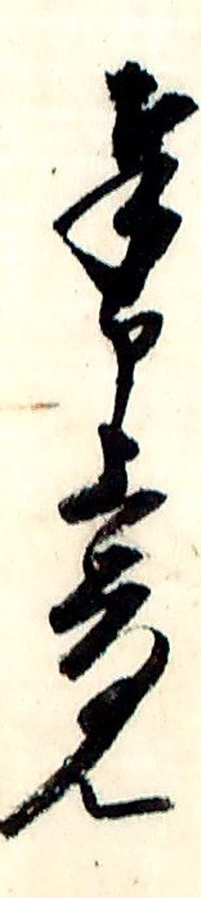奉申上覚
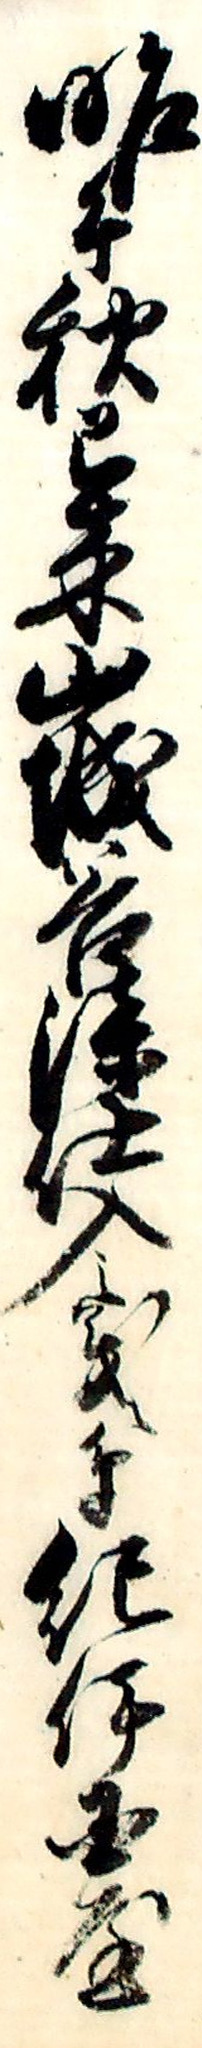昨子秋已来山城谷漆仕入之義に付紀伊国屋
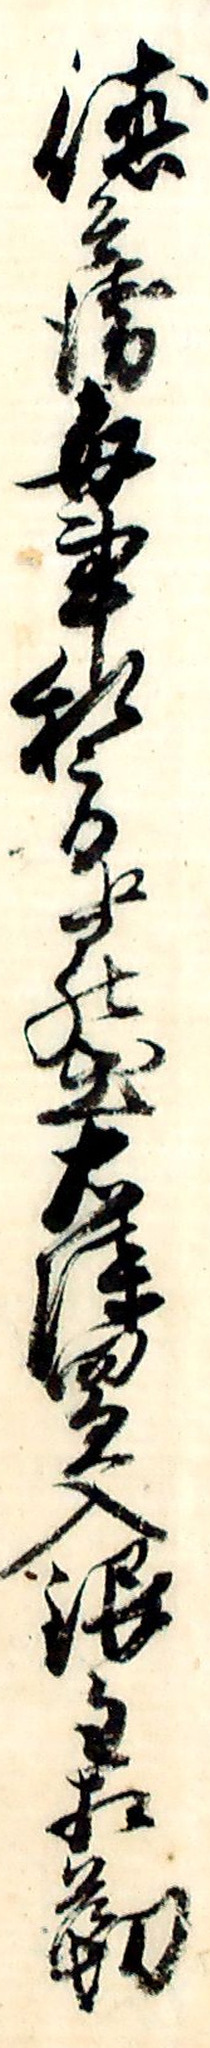徳兵衛毎事私方江罷出右漆買入銀主相勤
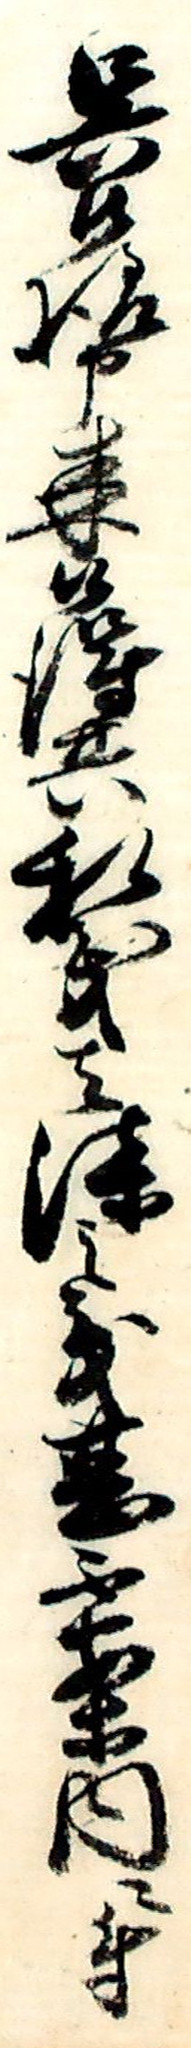呉候様申来候得共私義者漆之義甚不案内ニ付
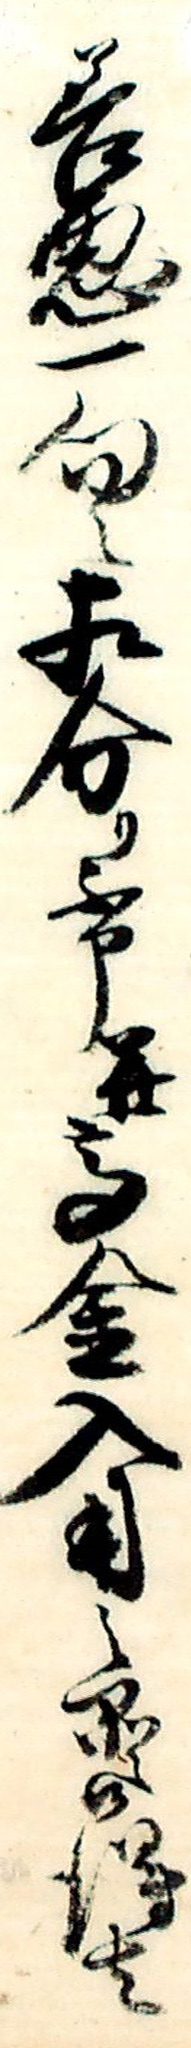善悪一向に相分り不申幷高金入用之品に候得者
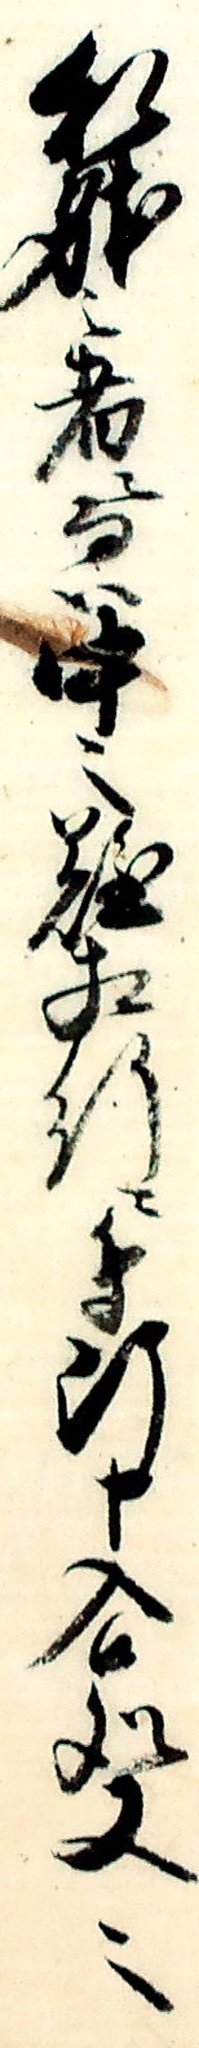私躰之者ニ而ハ中々難相行ニ付断申入候処又々
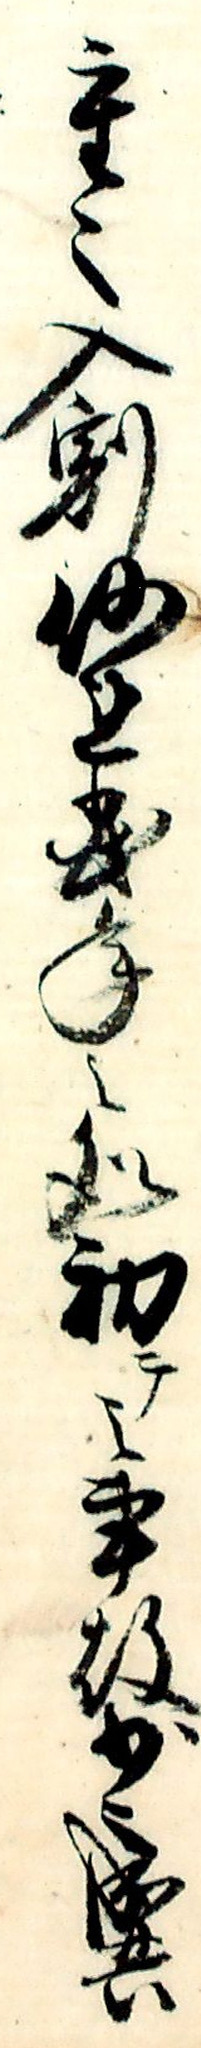重々入割何れ當年之処初テ之事故少々成共
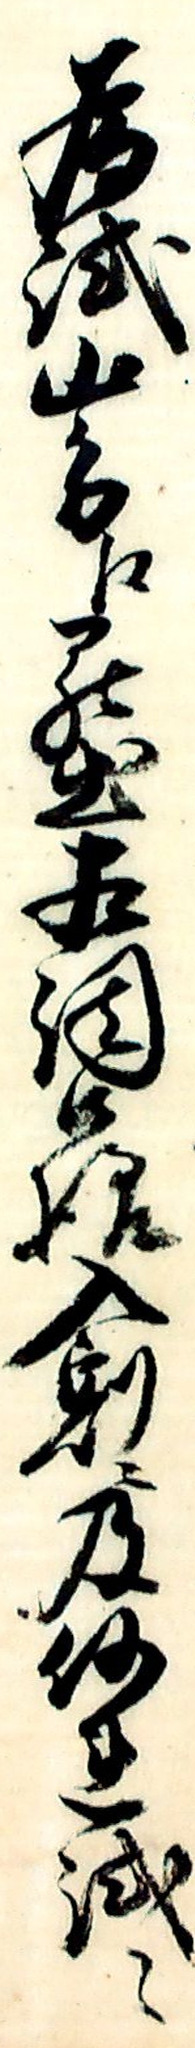為試山方江罷出相調候様入割に及何れ試之
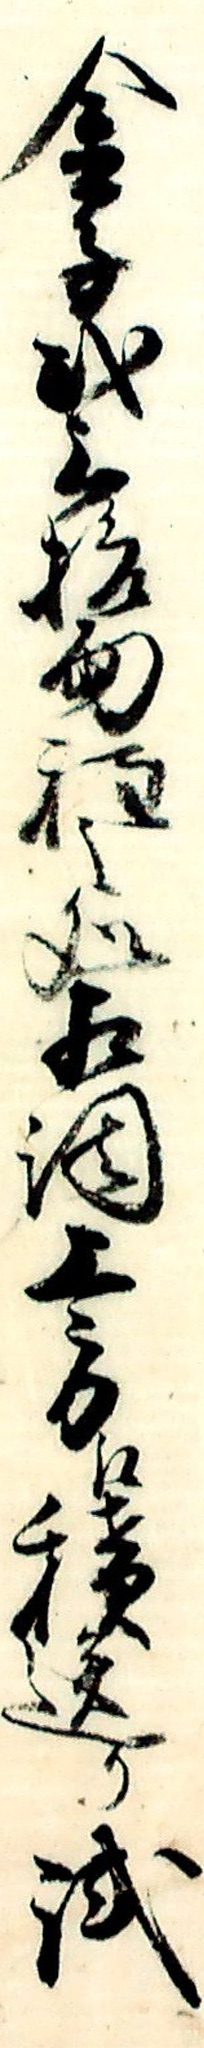金子弐三拾両程之処相調上方江積送り試
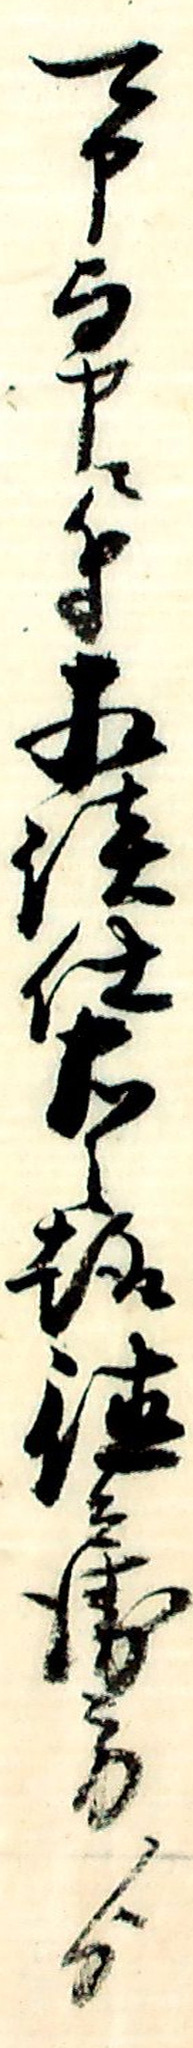可申と申ニ付相談仕右之趣徳兵衛方ゟ
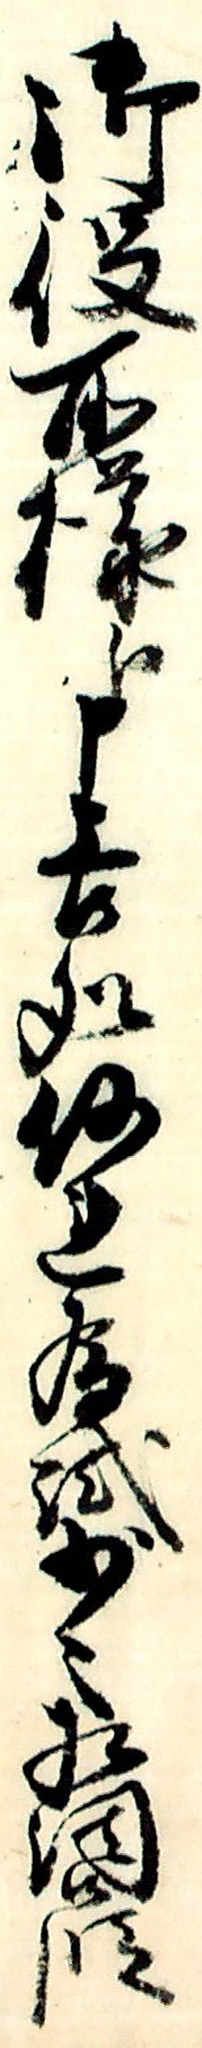御役所様江申上候処何れ為試少々相調候段
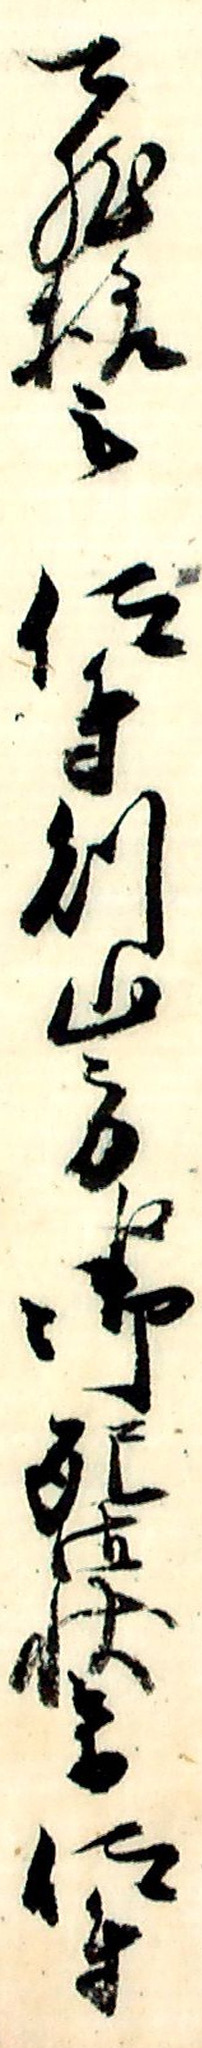可然様被仰付則山方江御配御状被為仰付
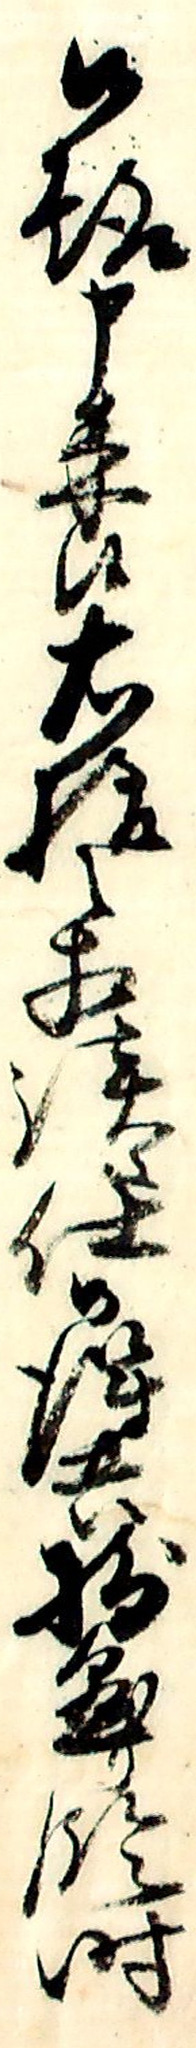候趣申来候右様之相談ニ仕候得共指懸り臨時
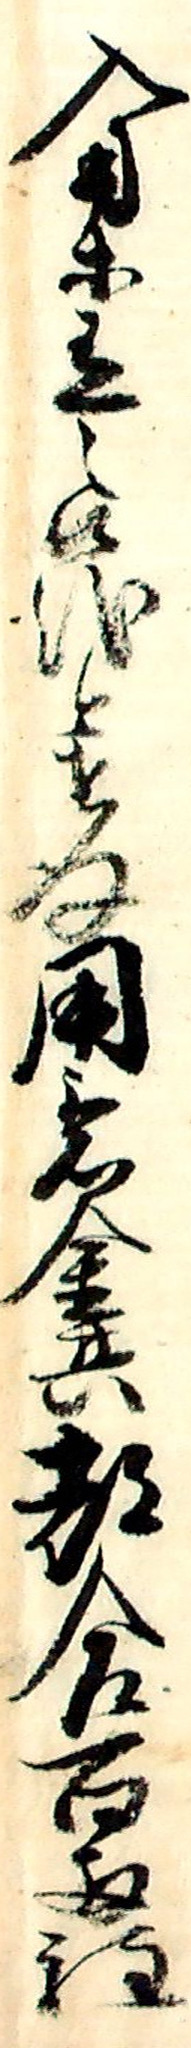入用等有之候哉と奉存用意金共都合百両程
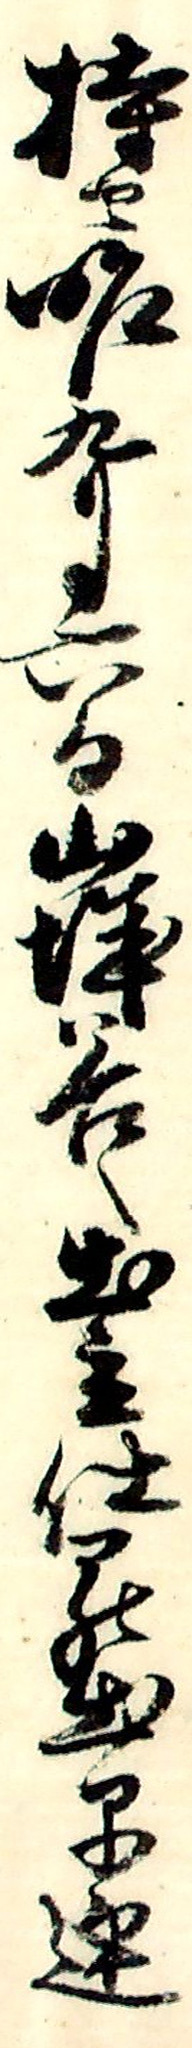持せ昨九月六日山城谷へ出立仕罷出早速
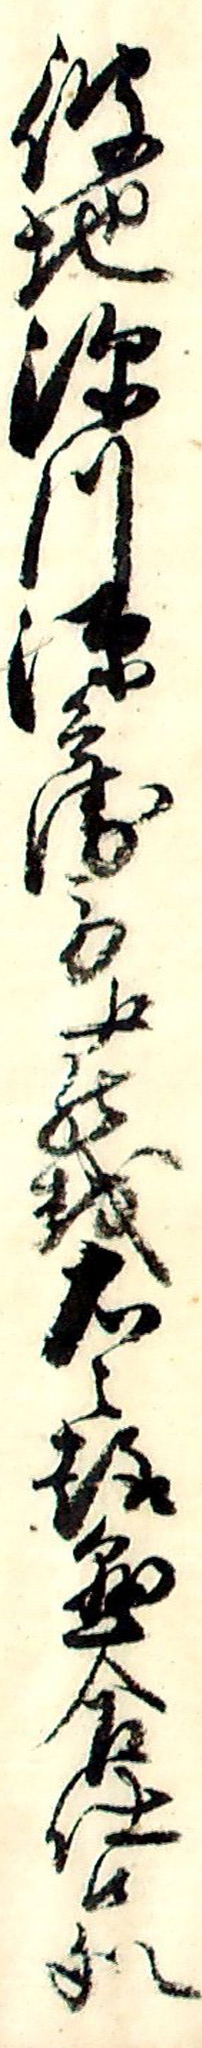彼地深川源兵衛方江罷越右之趣懸合仕候処
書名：奉申上覚（山城谷漆仕入買入銀主之義に付）
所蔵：鳴門教育大学 Naruto University of Education
